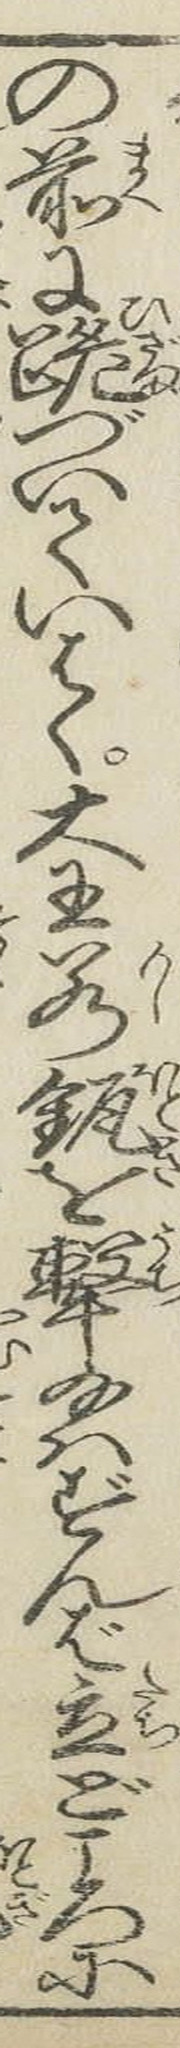の前に跪づいていはく。大王若缻を撃給はずんば立どころに
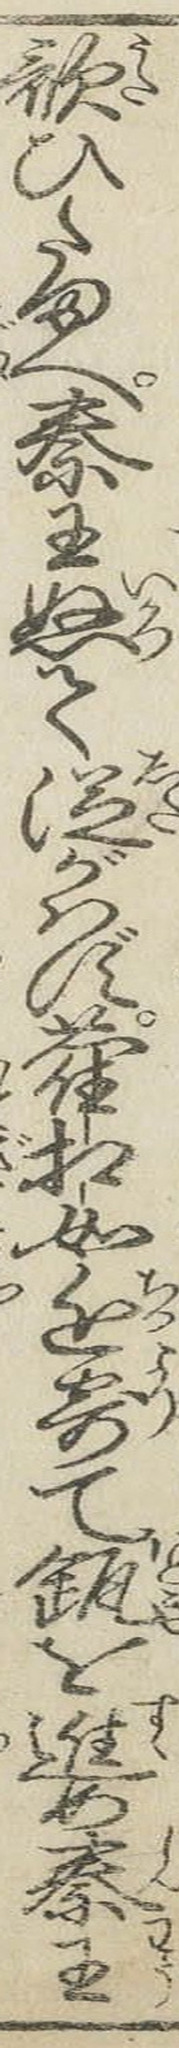歌ひたまへ。秦王怒て従がはず。藺-相-如近寄て缻を進め秦王
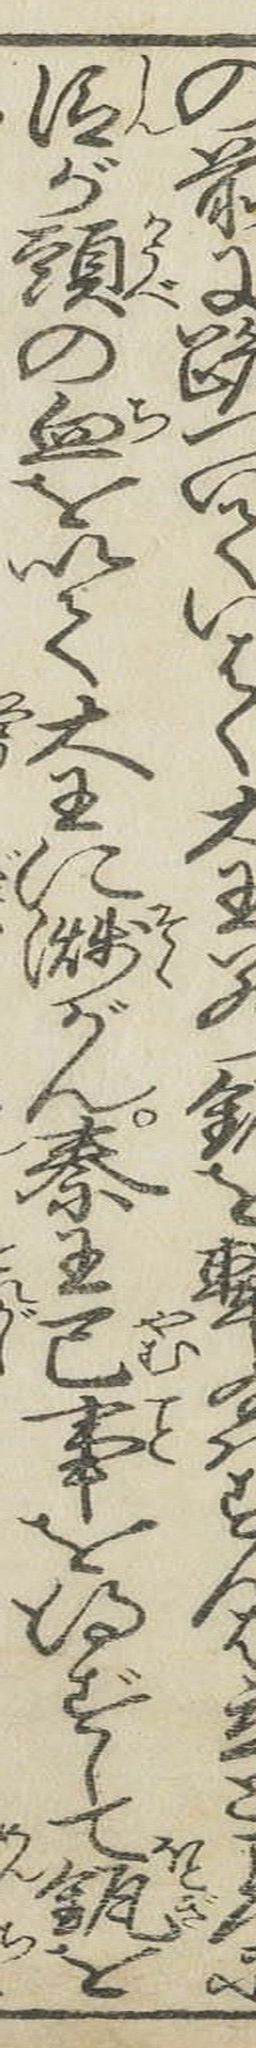臣が頭の血を以て大王に濺がん。秦王已事を得ずして缻を
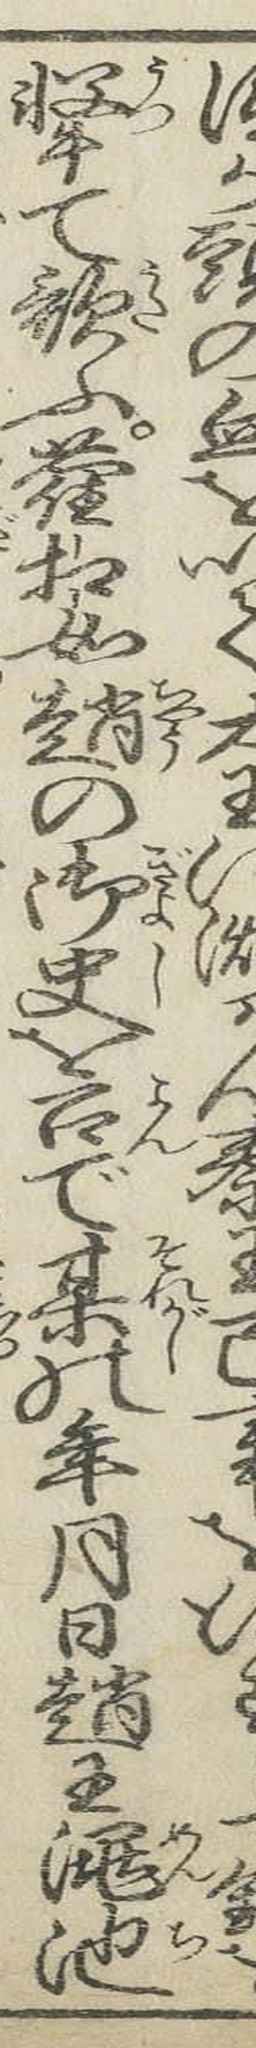撃て歌ふ。藺-相-如趙の御史を召で某の年月日趙王澠池
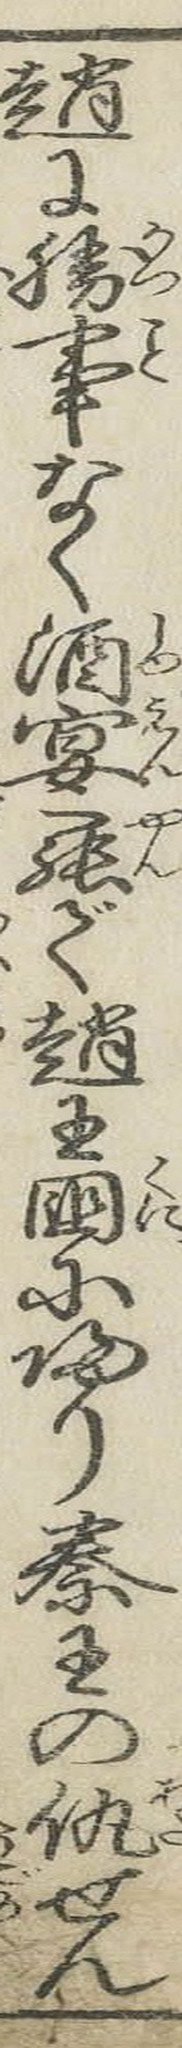趙に勝事なく酒宴罷で趙王国に帰り秦王の仇せん
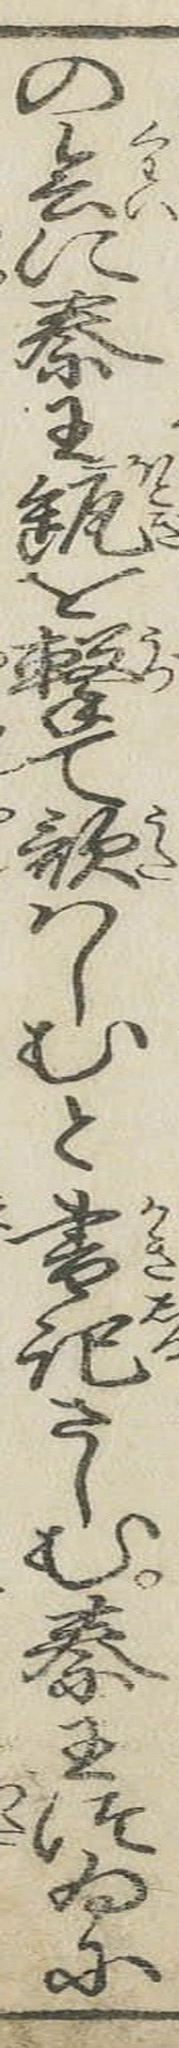の会に秦王缻を撃て歌はしむと書記さしむ。秦王つゐに
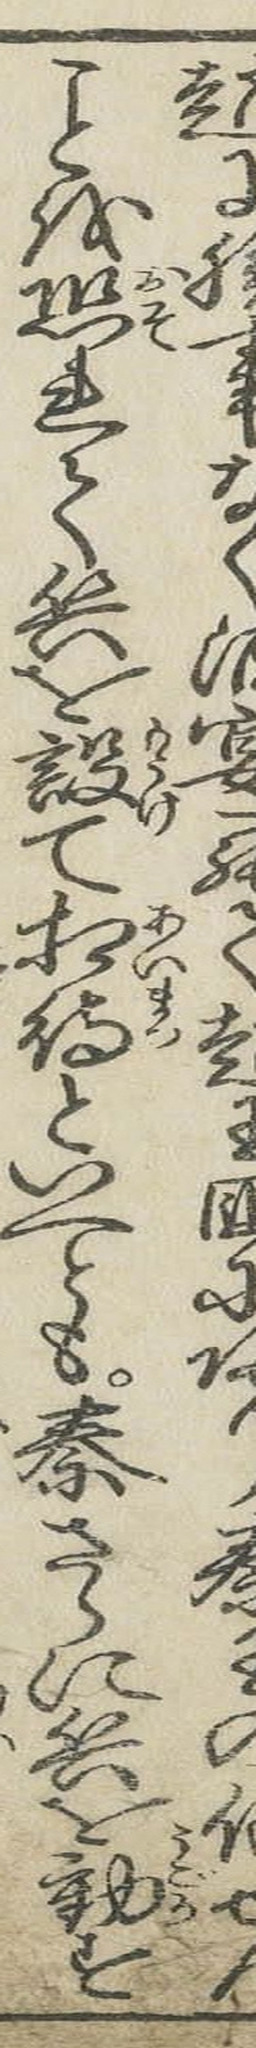ことを恐れて兵を設て相待といへとも。秦さらに兵を動す
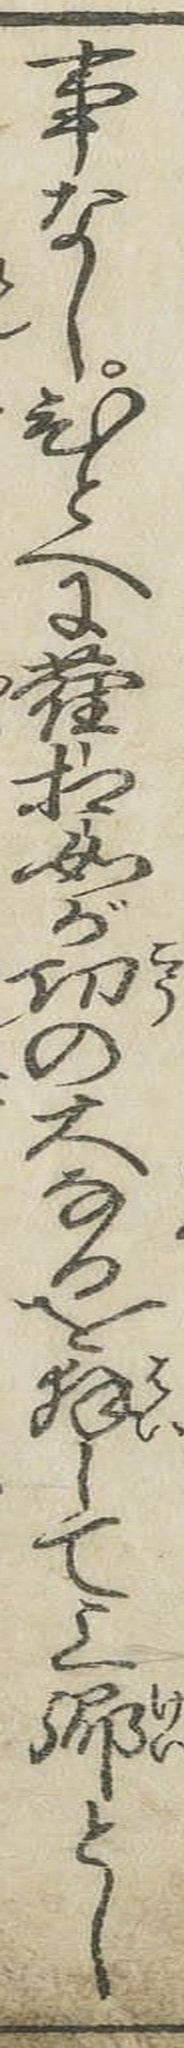事なし。ひとへに藺-相-如が功の大なるを拝して上卿とし
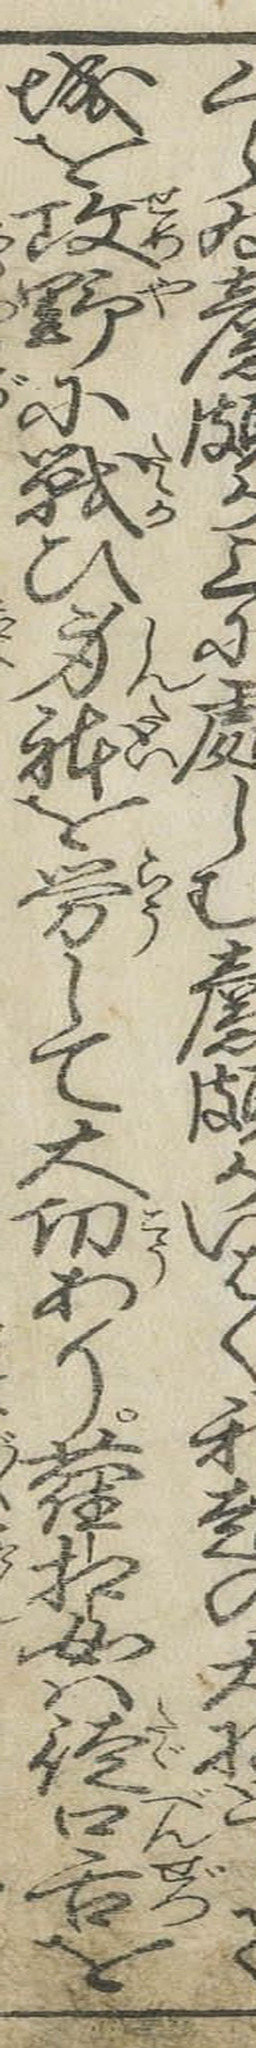城を攻野に戦ひ身体を労して大功あり。藺-相-如は徒口舌を
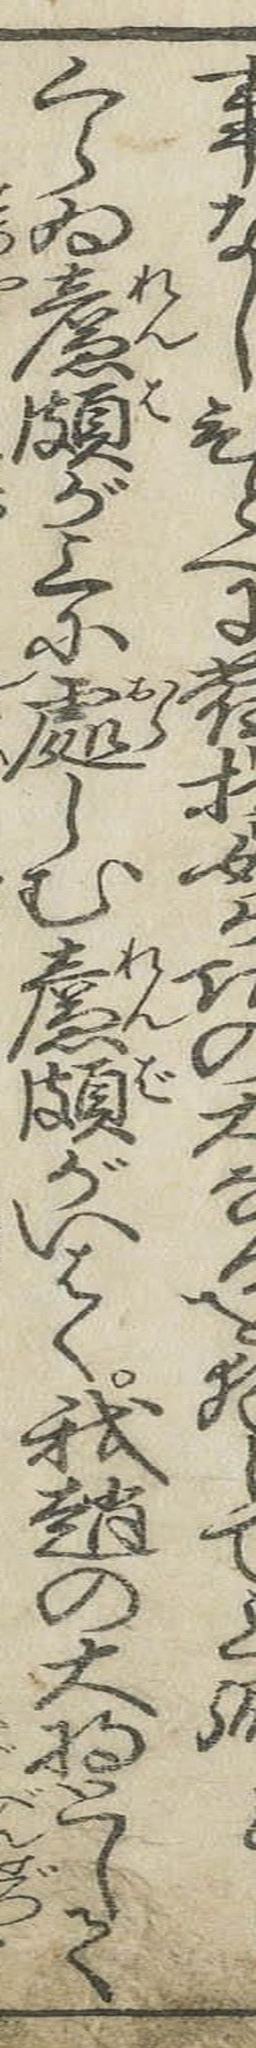くらゐ廉頗が上に処しむ廉頗がいはく。我趙の大将として
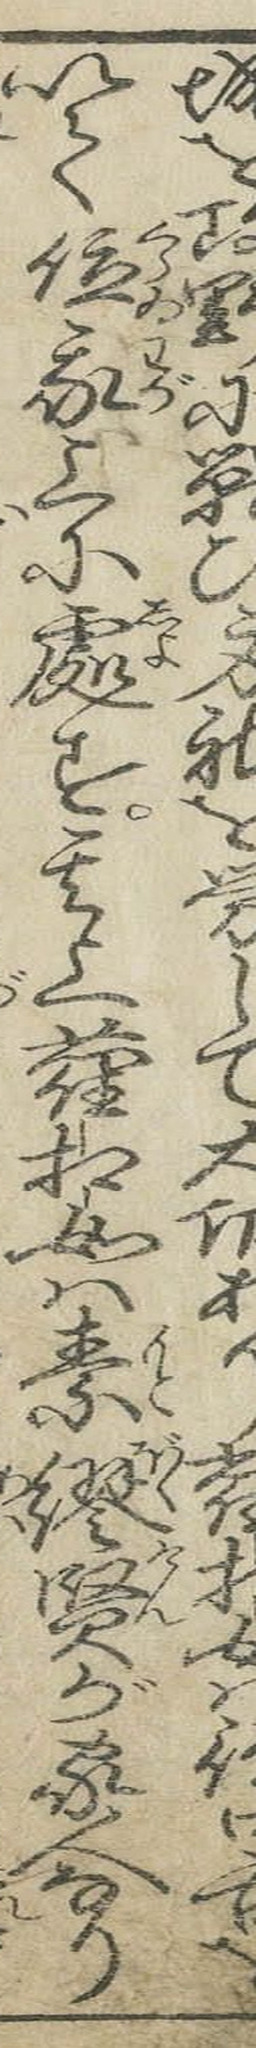以て位我上に処す。其上藺-相-如は素繆賢が家人なり
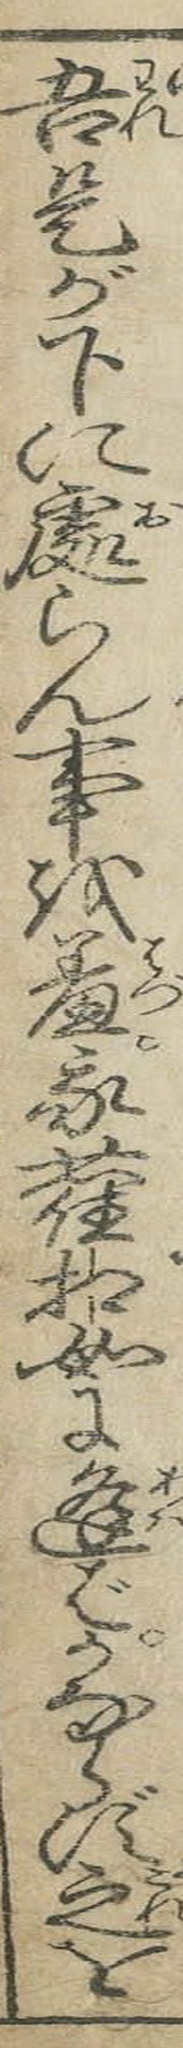吾是が下に処らん事を羞。我藺-相-如に逢ば。かならず之を

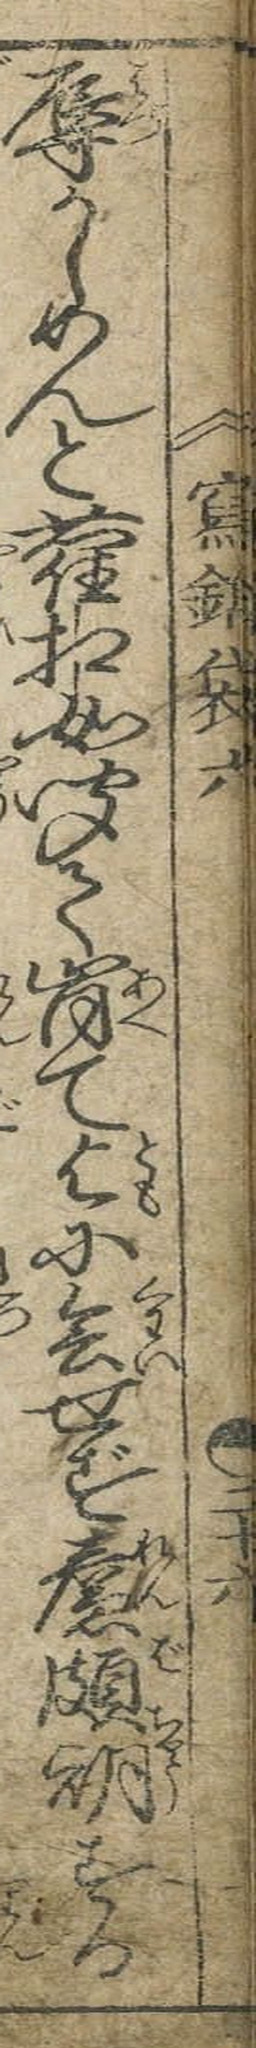辱かしめんと藺-相-如聞て肯て与に会せず廉頗朝する
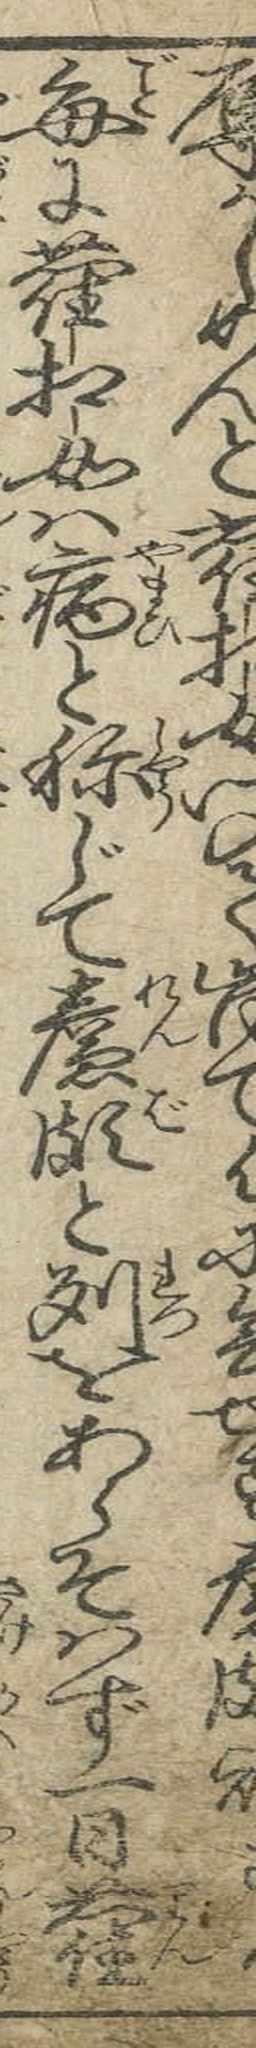毎に藺-相-如は病と称じて廉頗と列をあらそはず一日藺
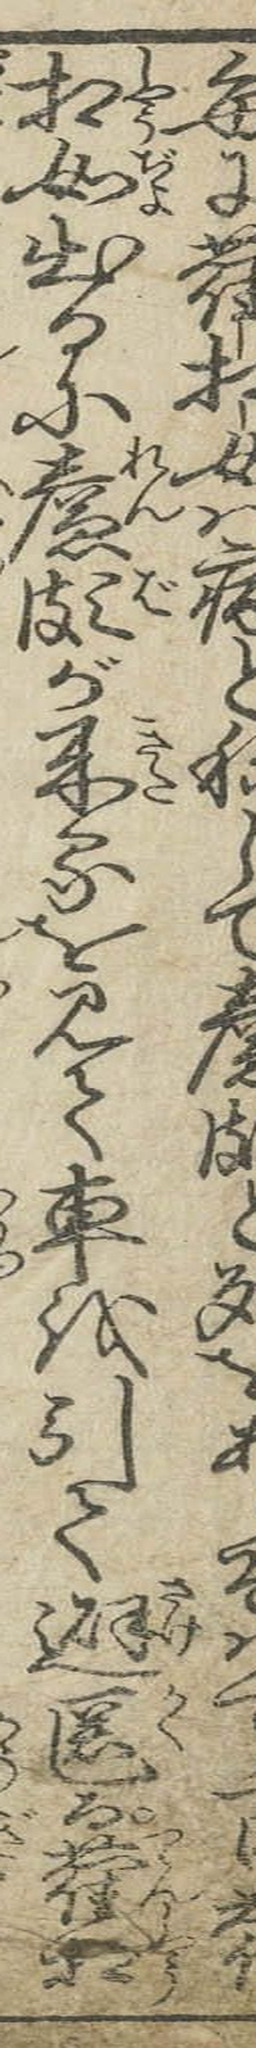相如出るに廉頗が来るを見て車を引て避匿る。藺相
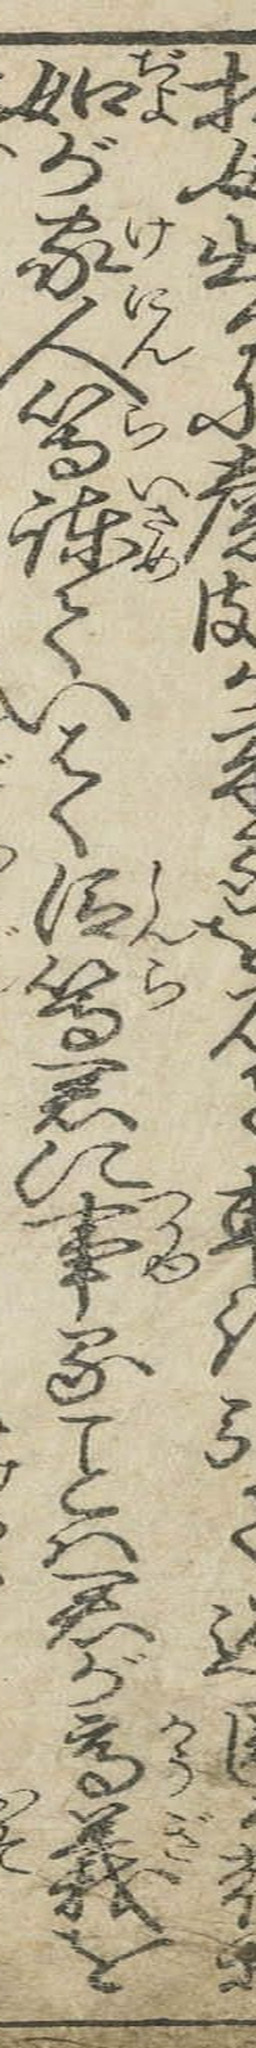如が家人等諫ていはく臣等君に事ることは君が高義を
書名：絵本写宝袋 9巻 6之巻
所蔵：東京学芸大学教育コンテンツアーカイブ
